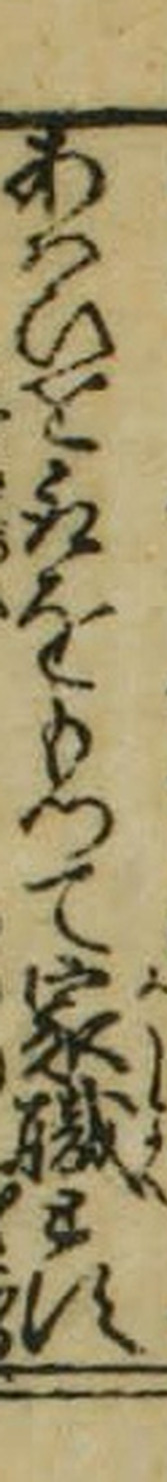あたひを取をもつて家職とす
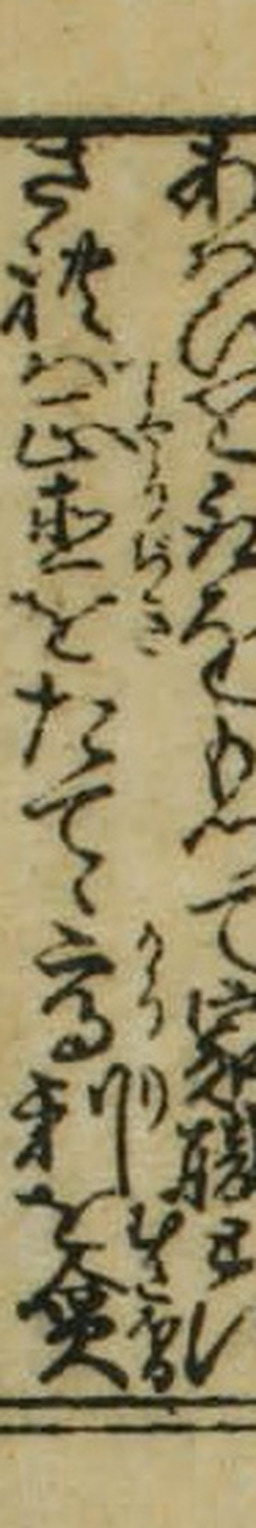されは正直をたてゝ高利を貪
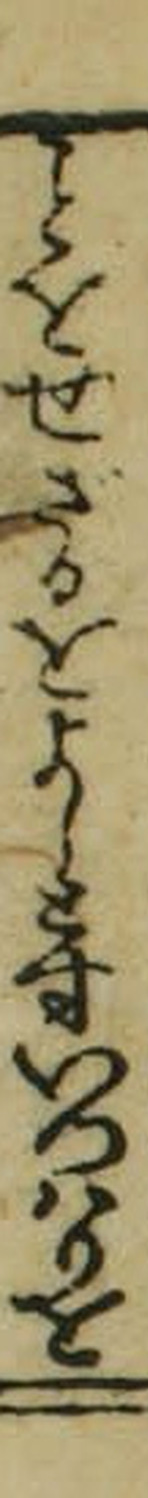ことをせざるをよしとすいつはりを
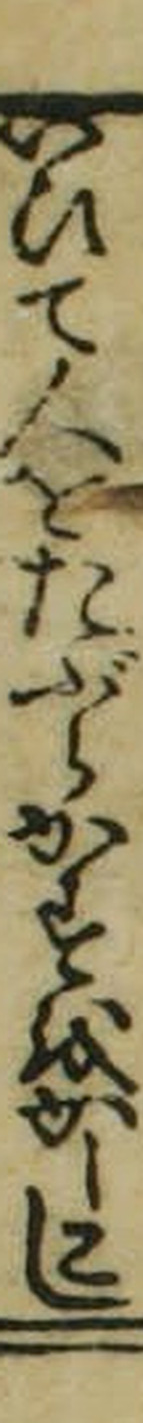いひて人をたぶらかすをかしこし
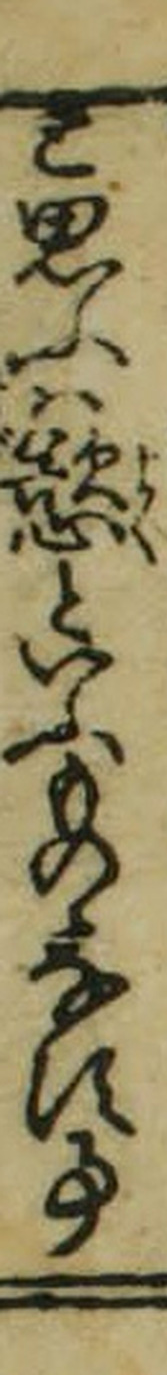と思ふは欲といふものなす事
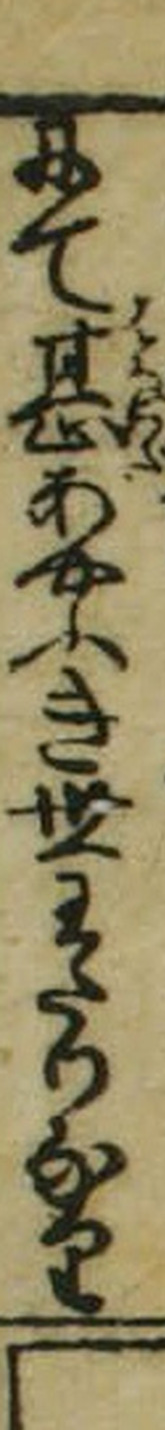にて甚あやふき世わたりなり

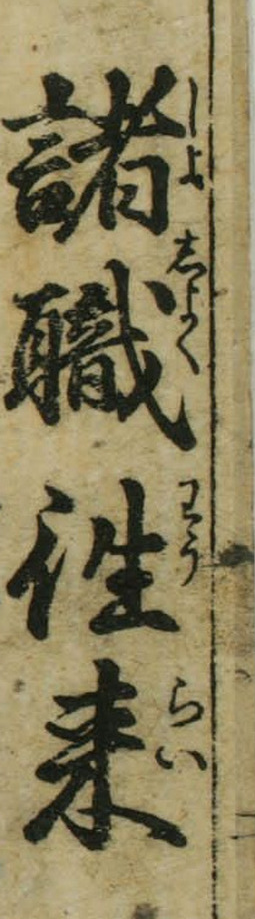諸職往来
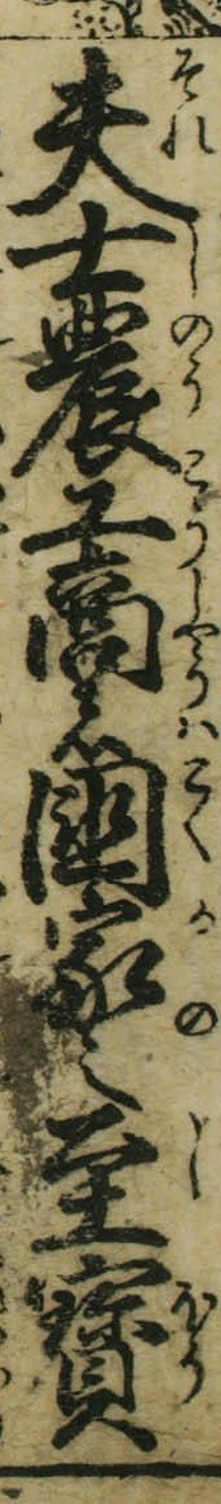夫士農工商は国家の至宝
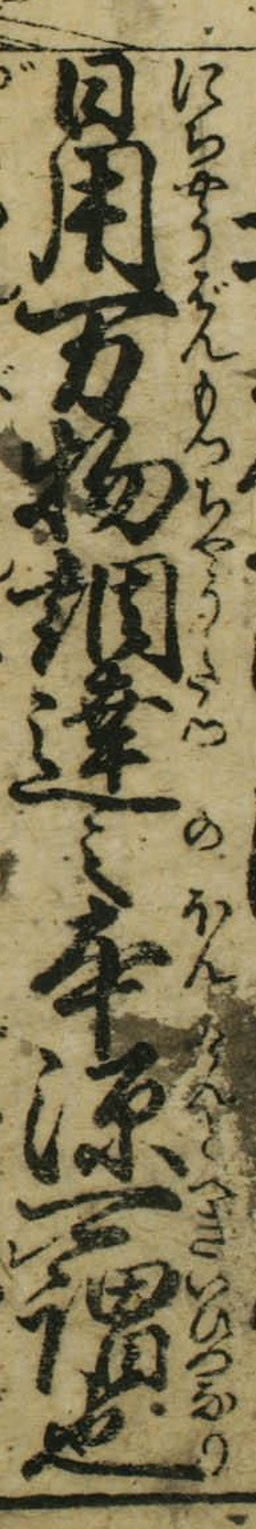日用万物調達の本源可謂也
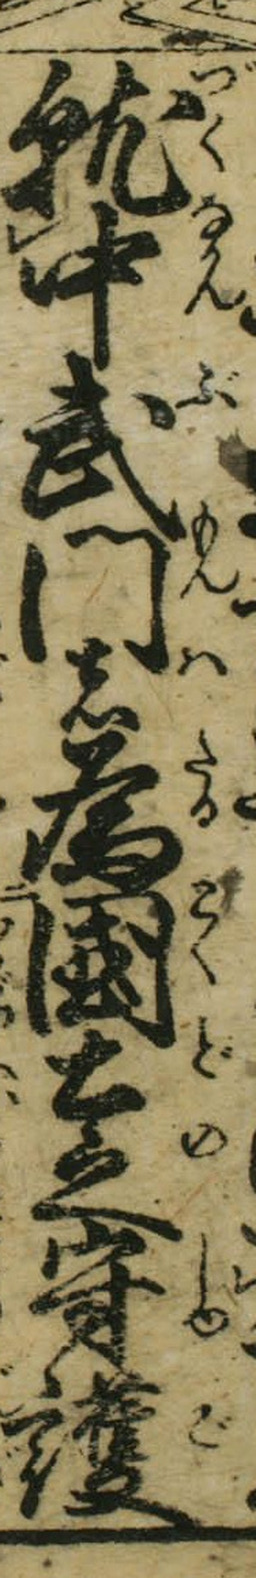就中武門は為国土の守護
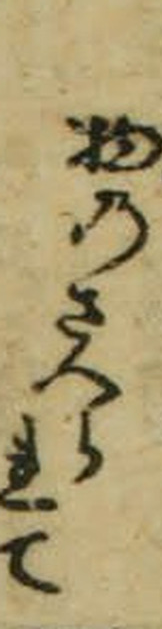物のさはかれて
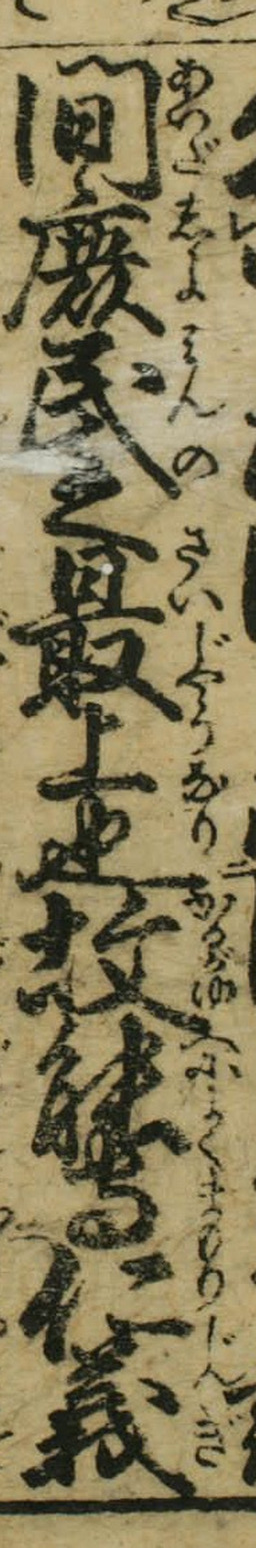間庶民の最上也故能守仁義
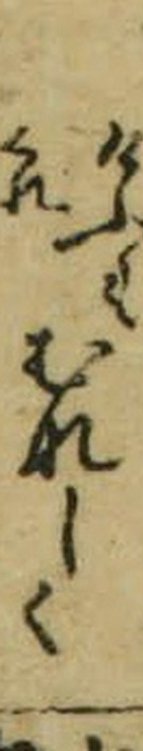けふもむなしく
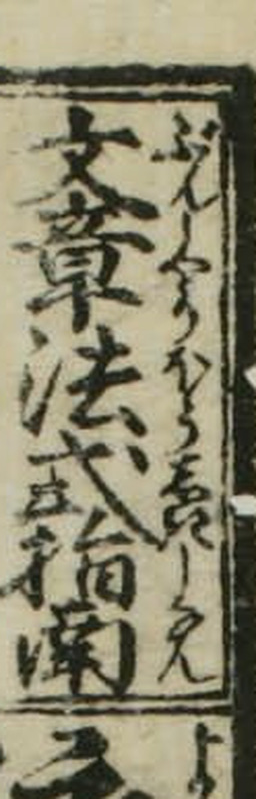文章方式指南
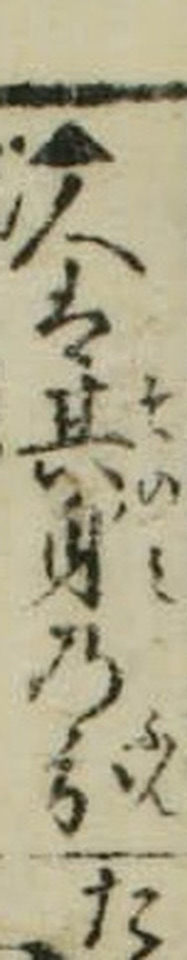▲人は其身の分
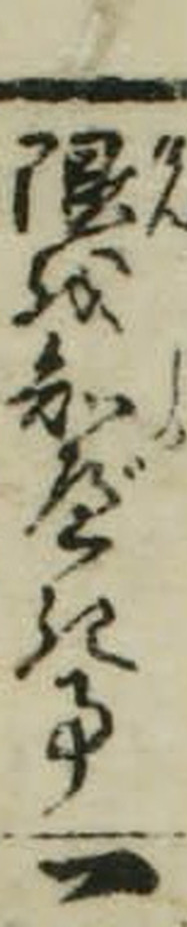限を知べき事
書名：増補職人往来
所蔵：東京学芸大学教育コンテンツアーカイブ
